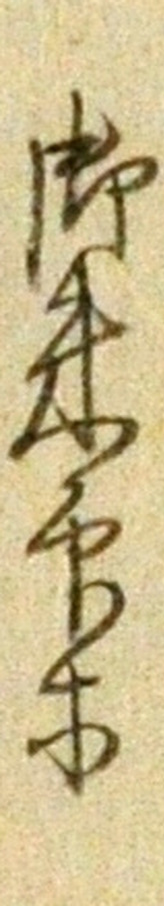御朱印等
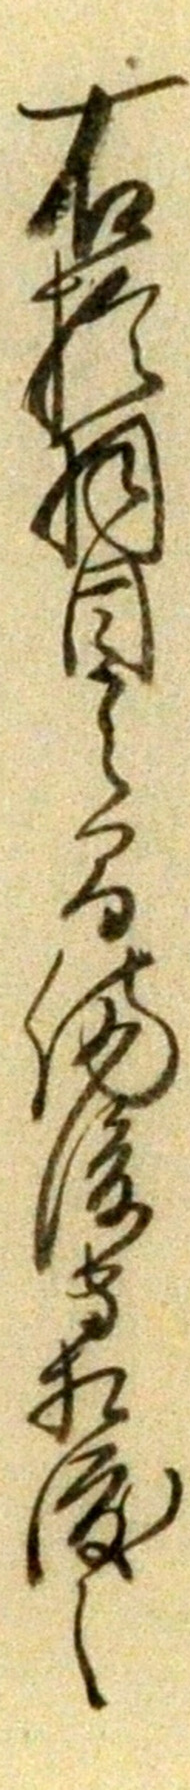右於羽目之間備後守相渡之
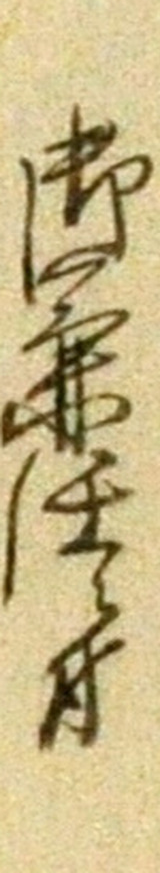御兼任ニ付
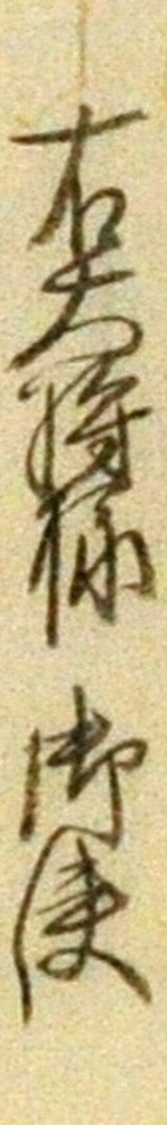右大将様御使
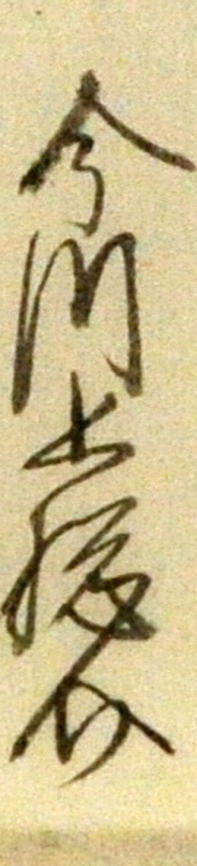今川上総介
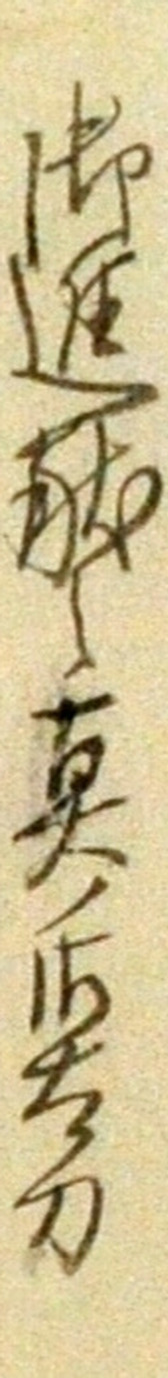御進献之真ノ御太刀
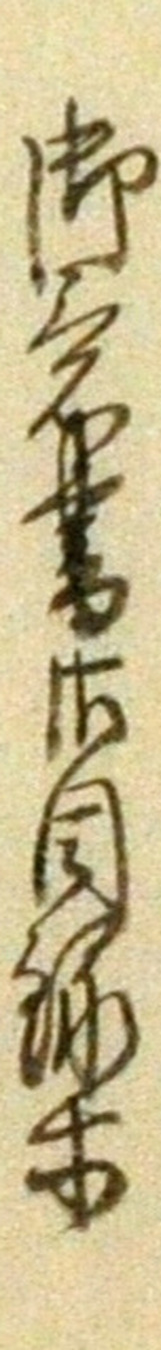御意書御目録等
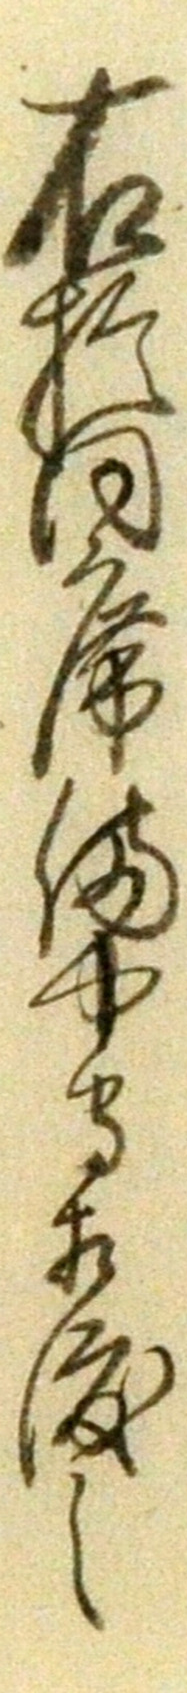右於同席備中守相渡之

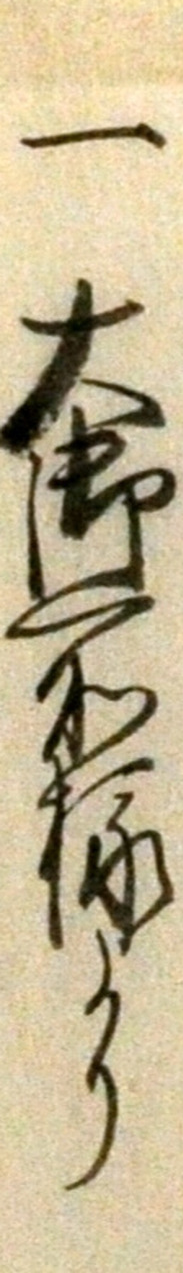一大御所様より
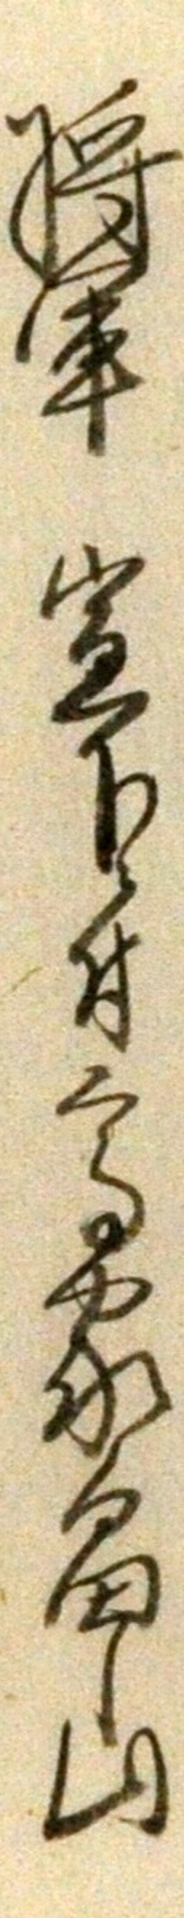将軍宣下ニ付高家畠山
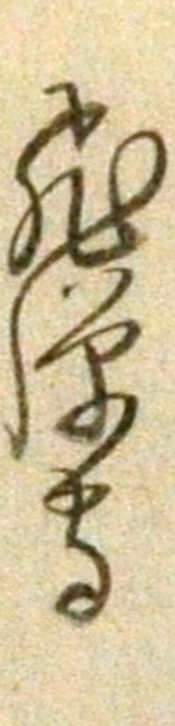飛騨守
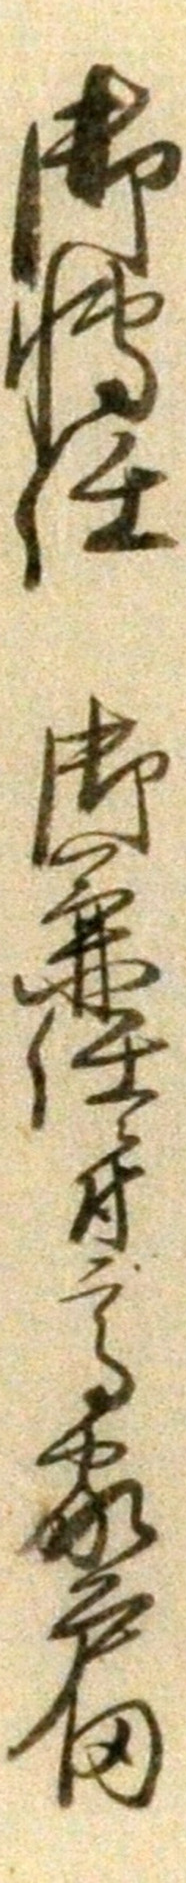御転任御兼任ニ付高家戸田
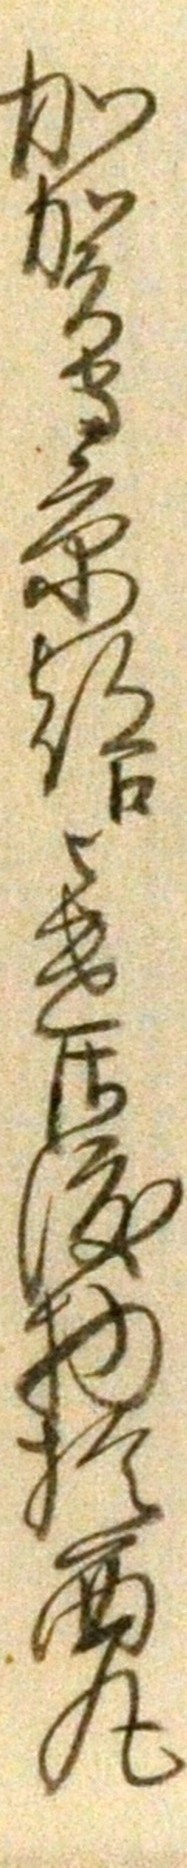加賀守京都え被遣御渡物於西丸
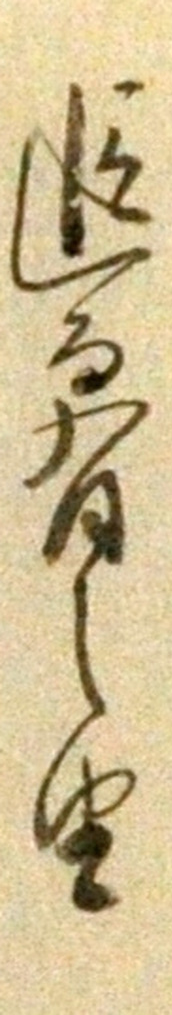追而有之由
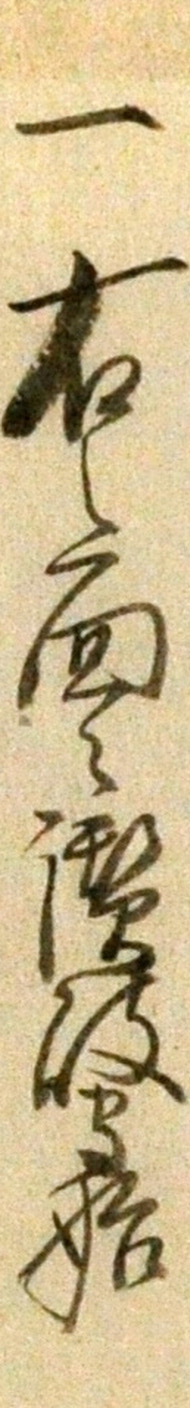一右之面々讃岐守始
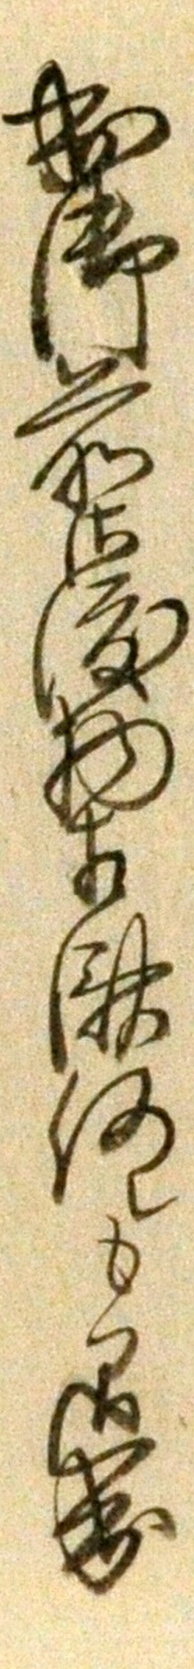出御前御渡物相済何レも退出
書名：御馳走御能ノ節ノ留外
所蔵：伊那市立高遠町図書館・合同会社AMANE
